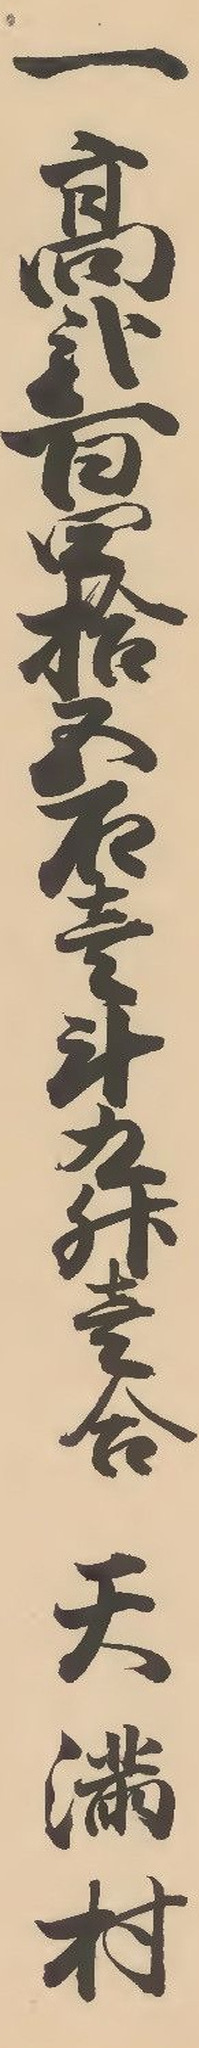一高弐百四拾五石壱斗九升壱合天満村
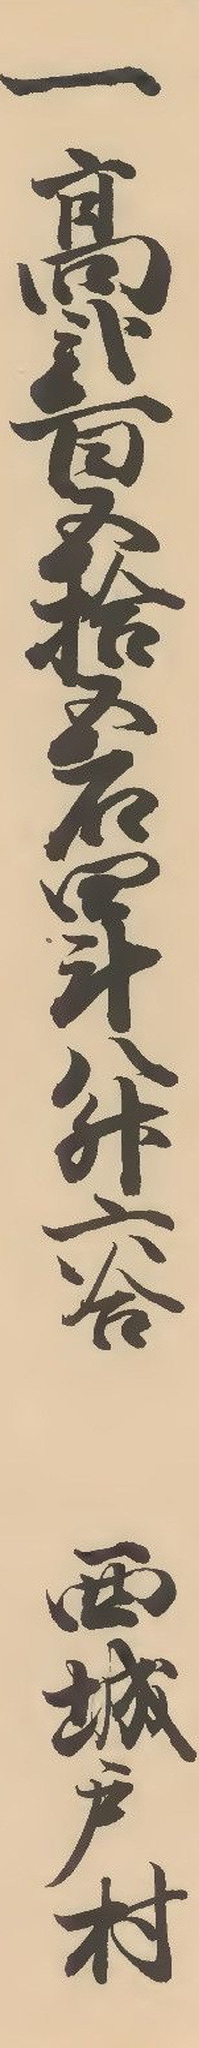一高弐百五拾五石四斗八升六合西城戸村
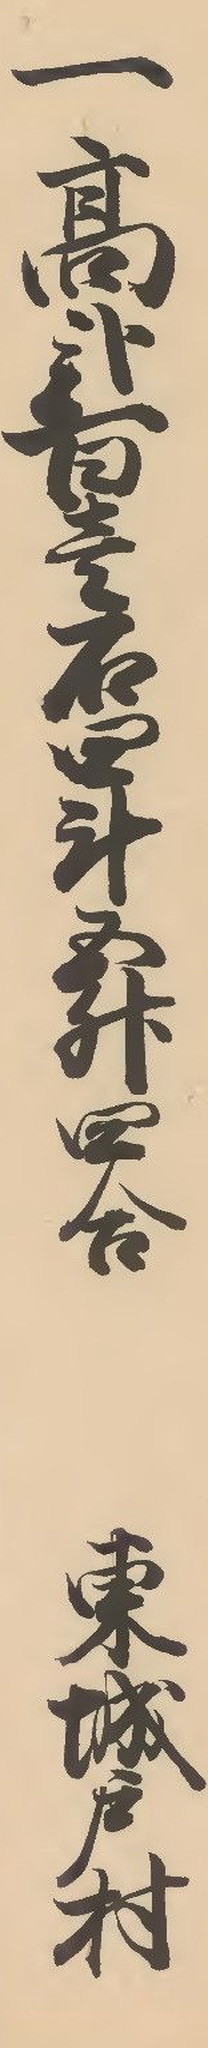一高弐百壱石四斗五升四合東城戸村
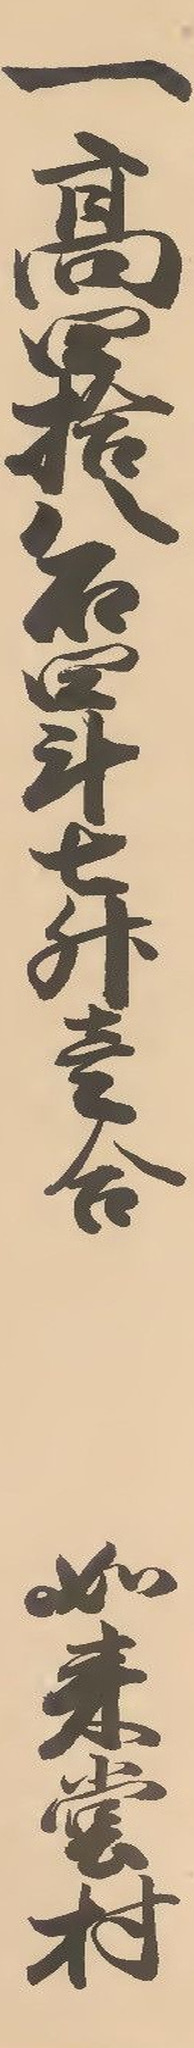一高四拾八石四斗七升壱合如来堂村
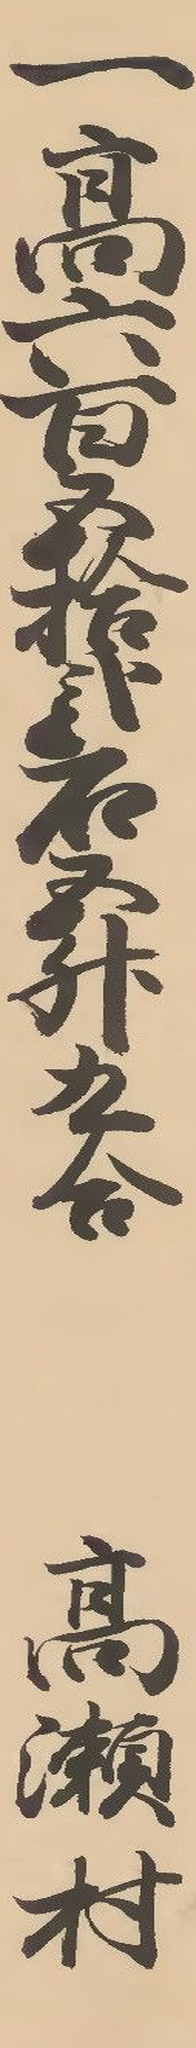一高六百五拾弐石五升九合高瀬村
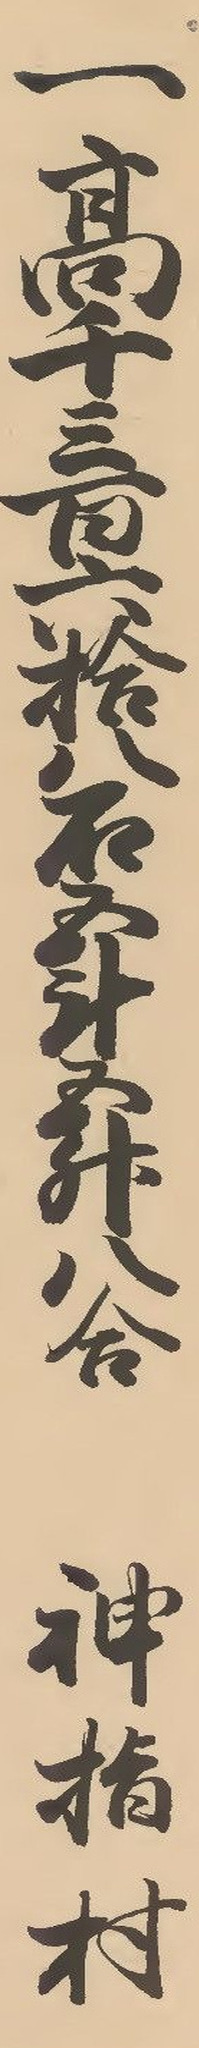一高千三百六拾八石五斗五升八合神指村
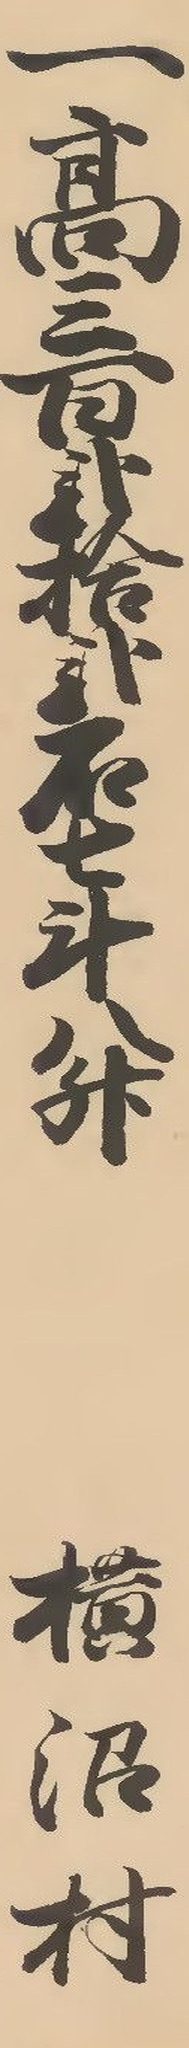一高三百弐拾弐石七斗八升横沼村

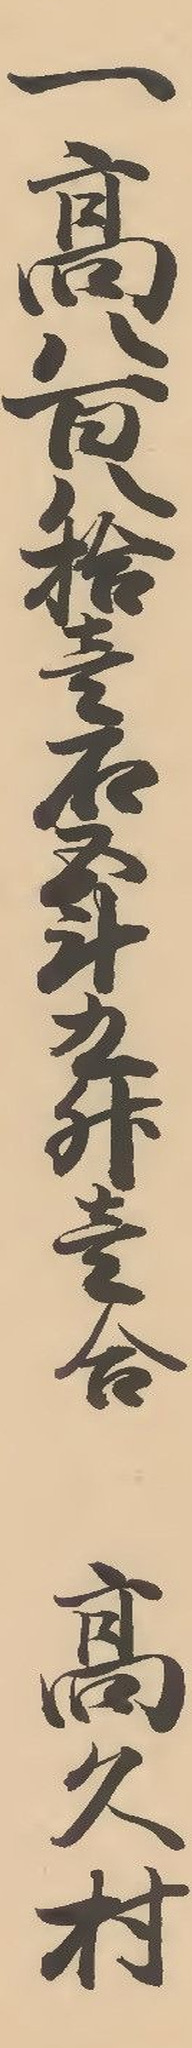一高八百八拾壱石五斗九升壱合高久村
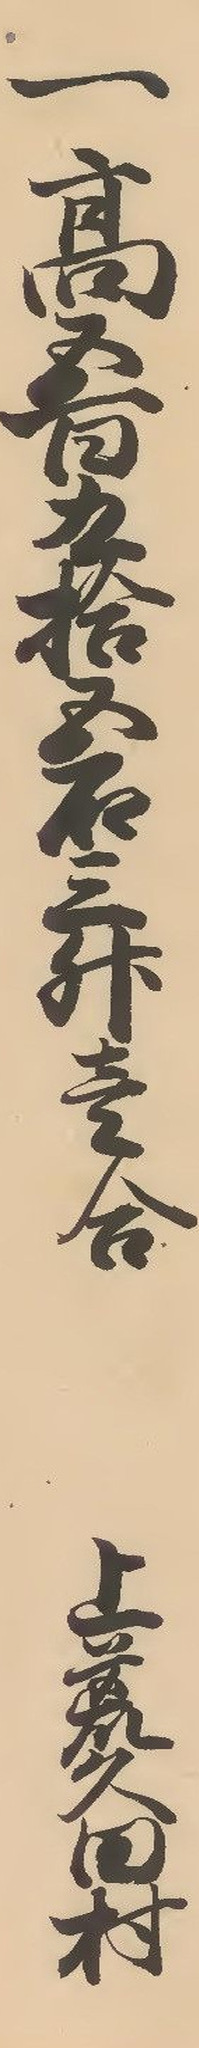一高五百九拾五石三升壱合上荒久田村
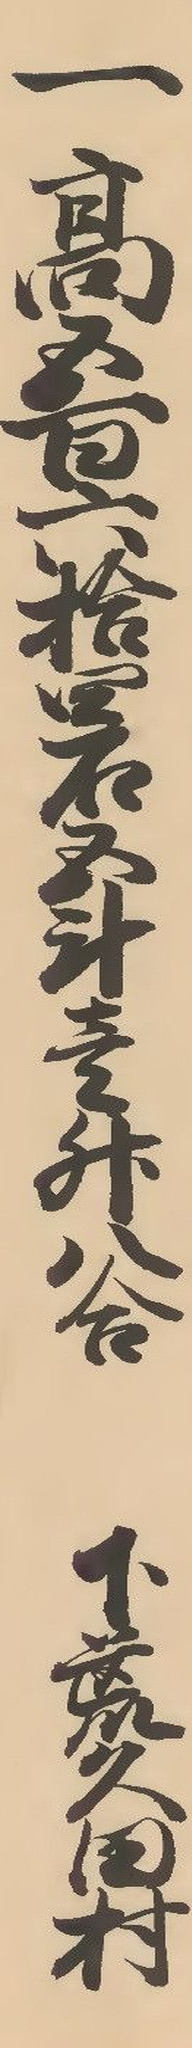一高五百六拾四石五斗壱升八合下荒久田村
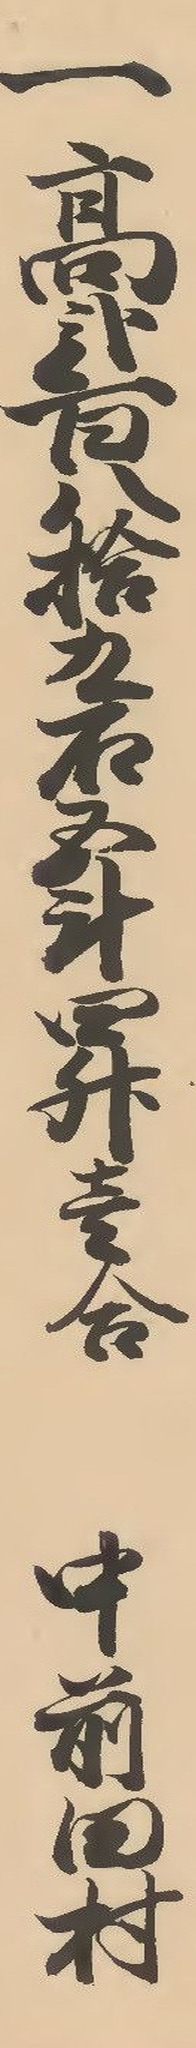一高弐百八拾九石五斗四升壱合中前田村
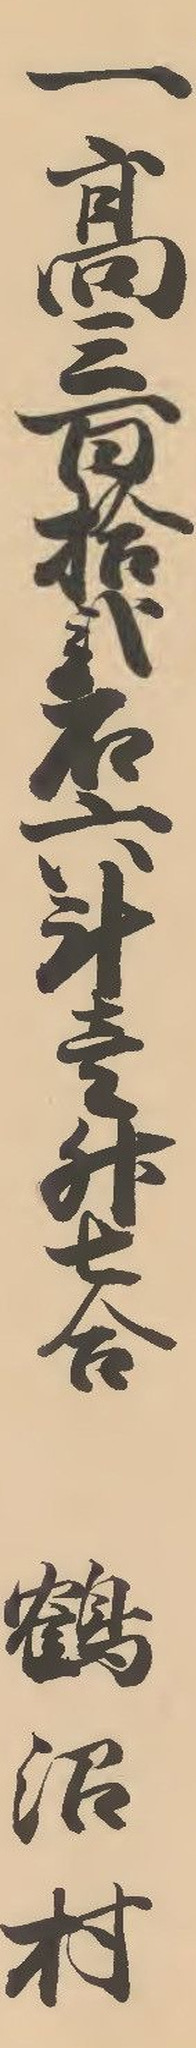一高三百拾弐石六斗壱升七合鶴沼村
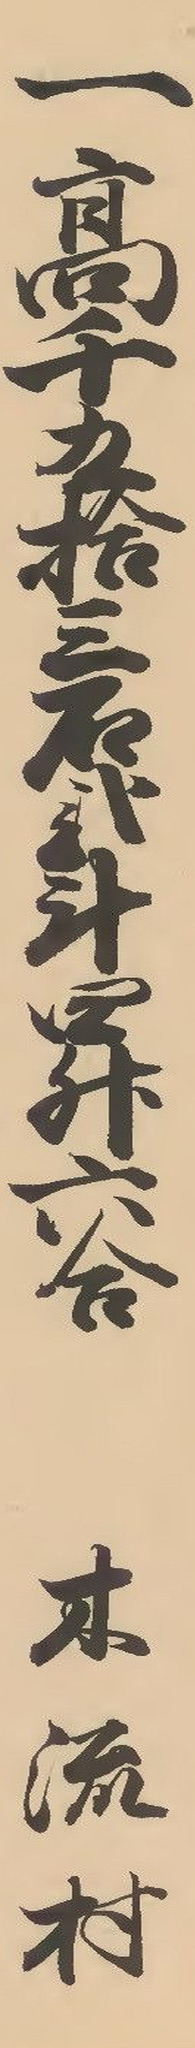一高千九拾三石弐斗四升六合木流村
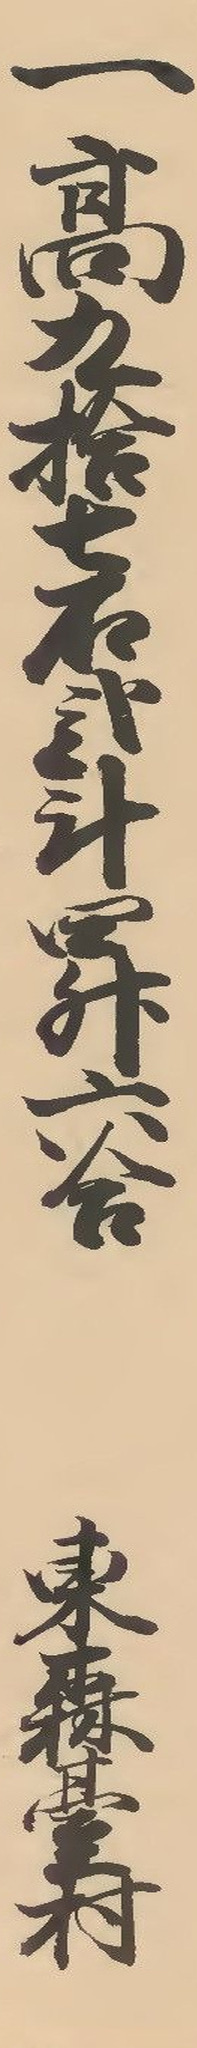一高九拾七石弐斗四升六合東森台村

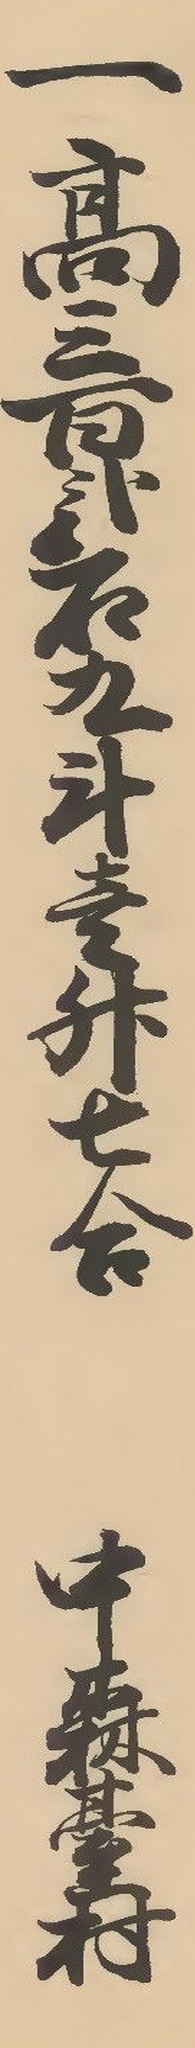一高三百弐石九斗壱升七合中森堂村
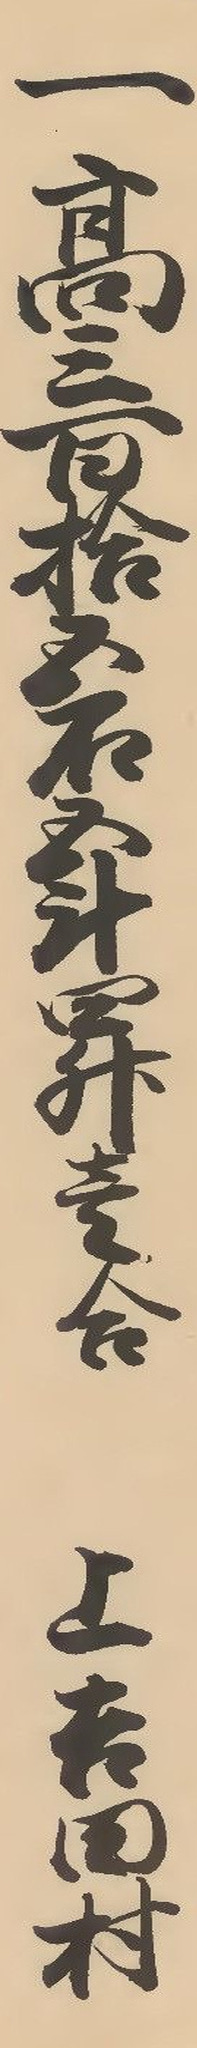一高三百拾五石五斗四升壱合上吉田村
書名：陸奥国郷帳　１
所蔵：国立公文書館 National Archives of Japan
